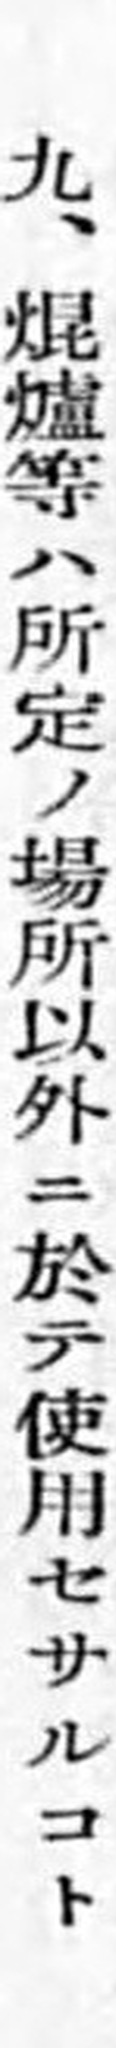九、焜炉等ハ所定ノ場所以外ニ於テ使用セサルコト

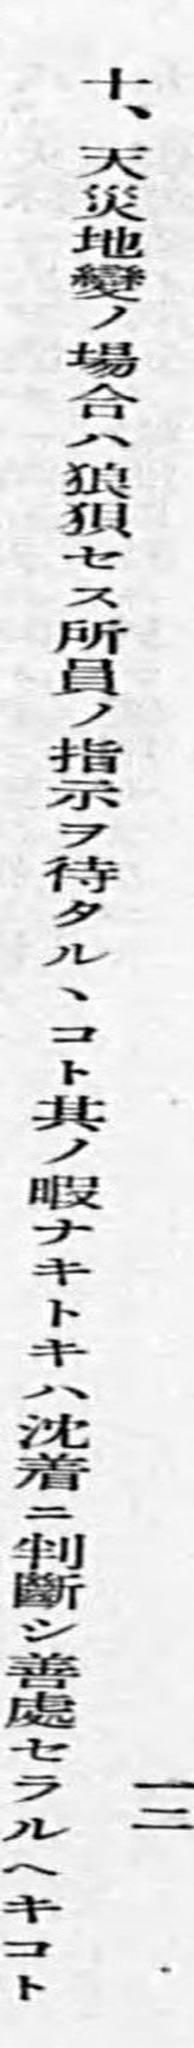十、天災地変ノ場合ハ狼狽セス所員ヲ指示ヲ待タルヽコト其ノ暇ナキトキハ沈着ニ判断シ善処セラルヘキコト
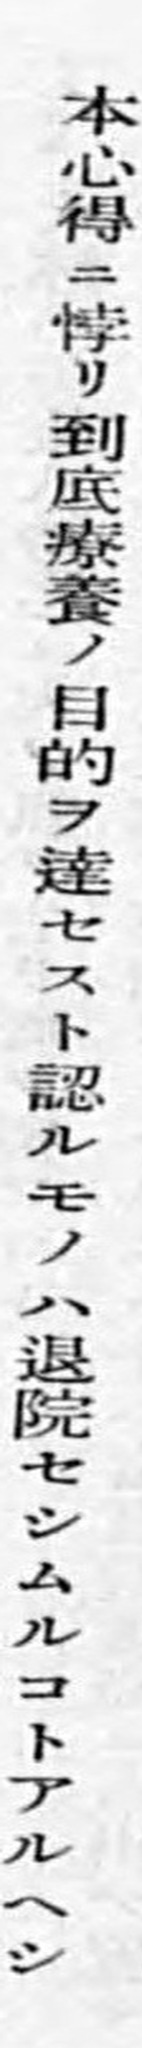本心得ニ悖リ到底療養ノ目的ヲ達セスト認ルモノハ退院セシムルコトアルヘシ
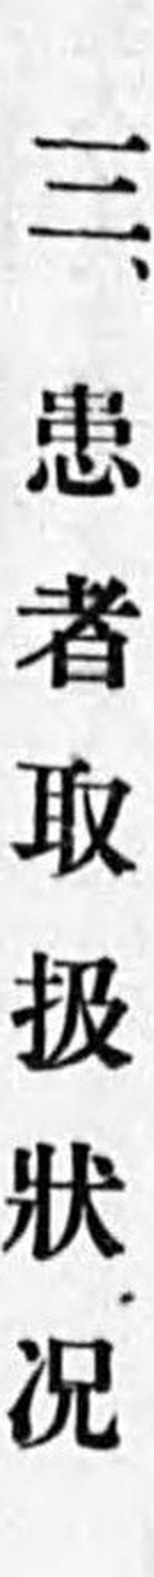三、患者取扱状況
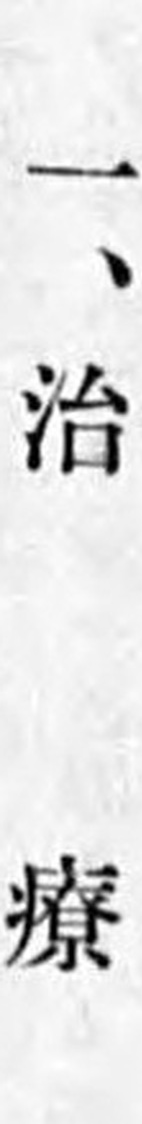一、治療
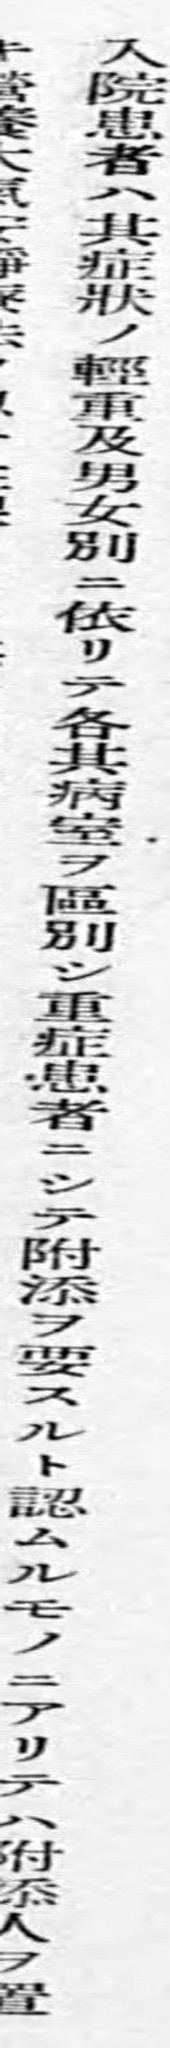入院患者ハ其症状ノ軽重及男女別ニ依リテ各其病室ヲ区別シ重症患者ニシテ附添ヲ要スルト認ムルモノニアリテハ附添人ヲ置
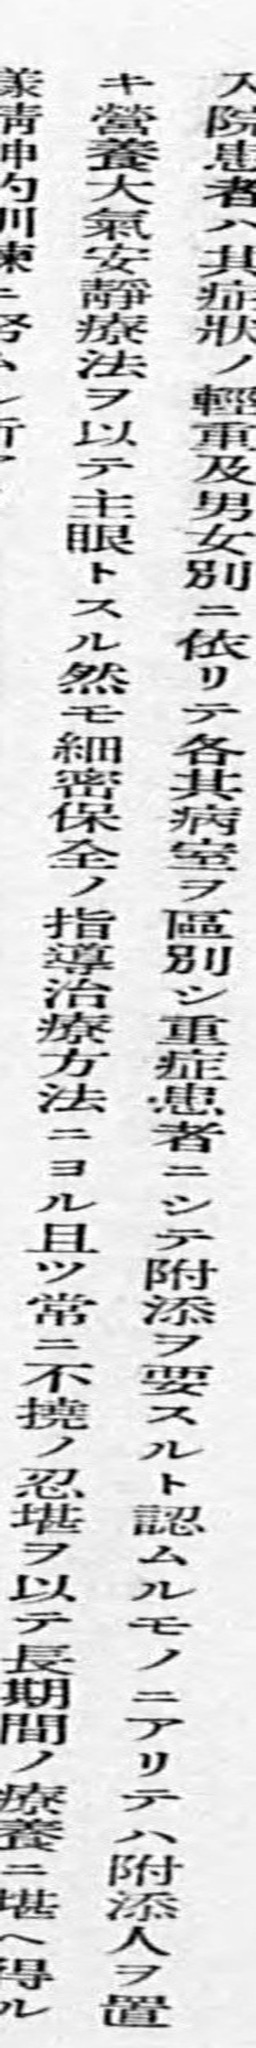キ営養大気安静療法ヲ以テ主眼トスル然モ細密保全ノ指導治療方法ニヨル且ツ常ニ不撓ノ忍堪ヲ以テ長期間ノ療養ニ堪へ得ル
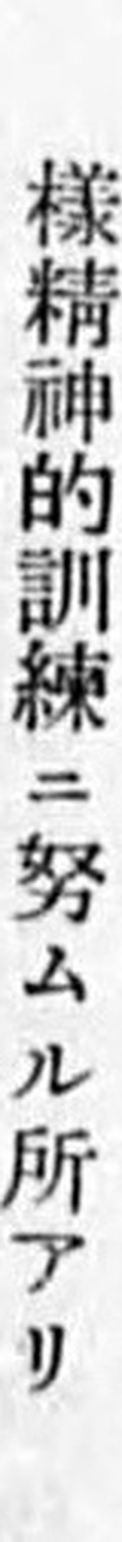様精神的訓練ニ努ムル所アリ
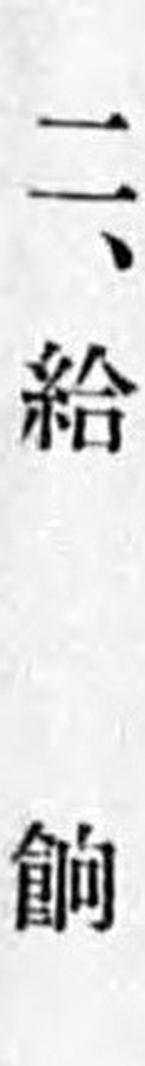二、給餉
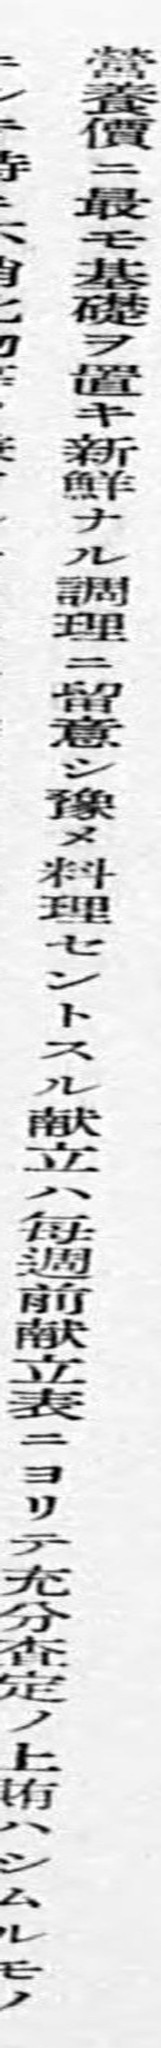営養価ニ最モ基礎ヲ置キ新鮮ナル調理ニ留意シ予メ料理セントスル献立ハ毎週前献立表ニヨリテ充分査定ノ上賄ハシムルモノ
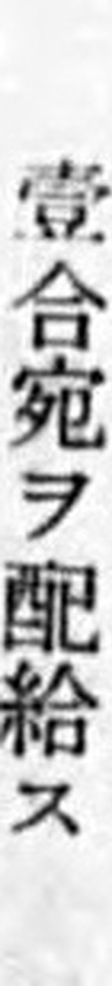壱合宛ヲ配給ス
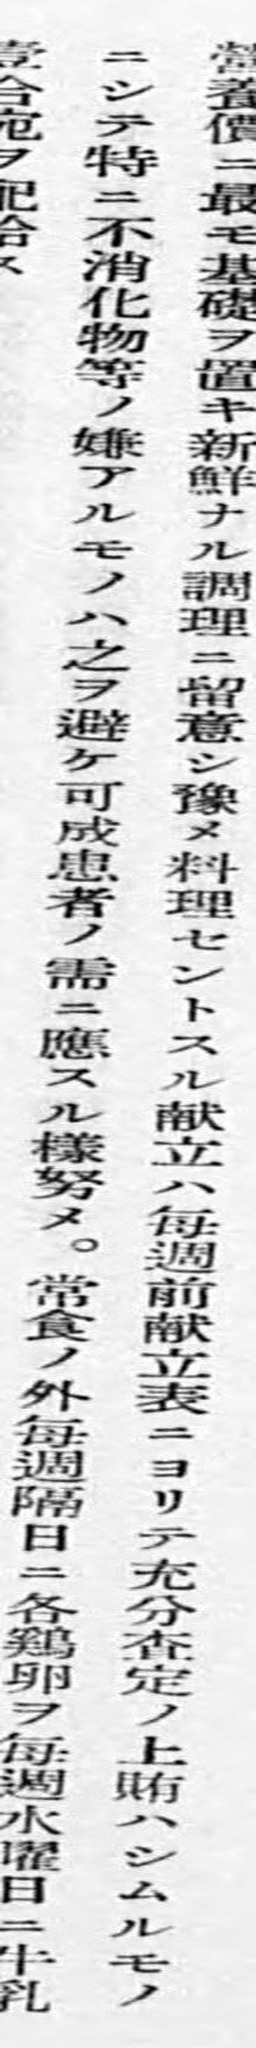ニシテ特ニ不消化物等ノ嫌アルモノハ之ヲ避ケ可成患者ノ需ニ応スル様努メ。常食ノ外毎週隔日ニ各鶏卵ヲ毎週水曜日ニ牛乳
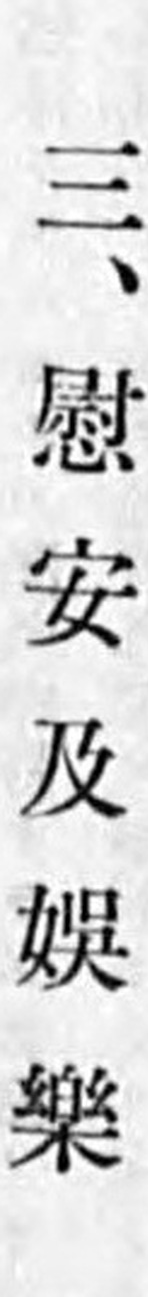三、慰安及娯楽
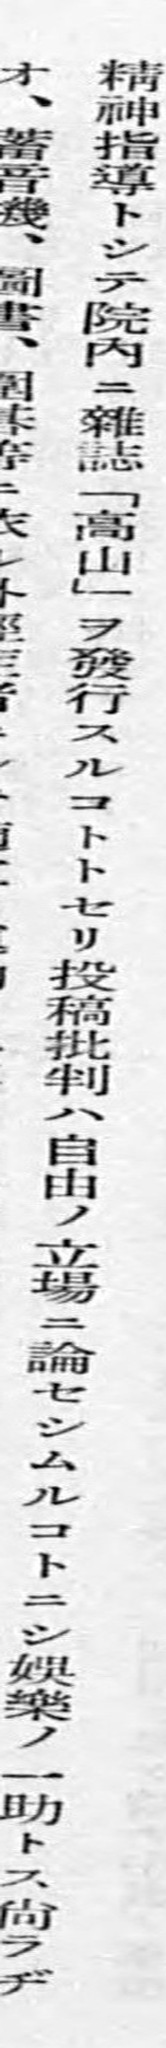精神指導トシテ院内ニ雑誌「高山」ヲ発行スルコトトセリ投稿批判ハ自由ノ立場ニ論セシムルコトニシ娯楽ノ一助トス尚ラヂ
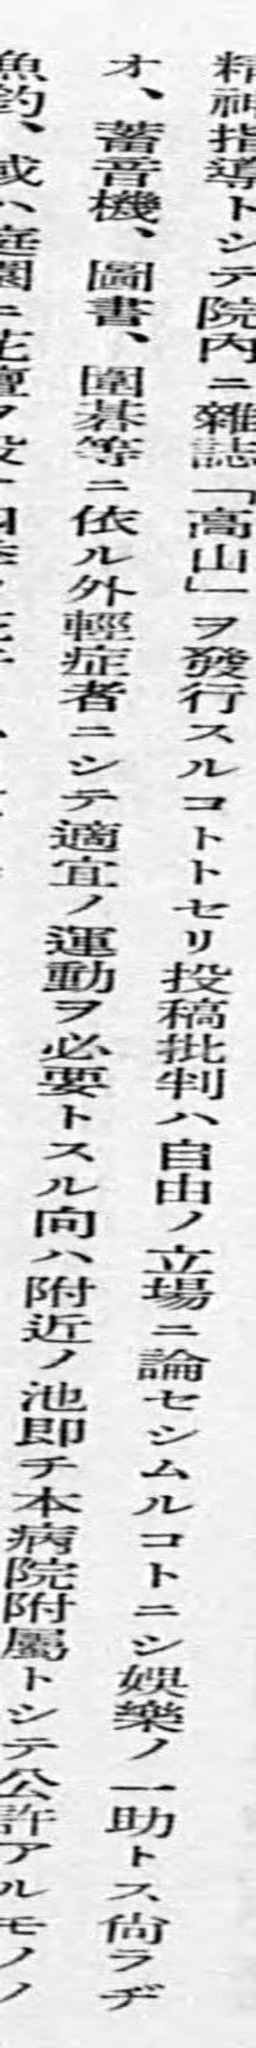オ、蓄音機、図書、囲碁等ニ依ル外軽症者ニシテ適宜ノ運動ヲ必要トスル向ハ附近ノ池即チ本病院附属トシテ公許アルモノノ
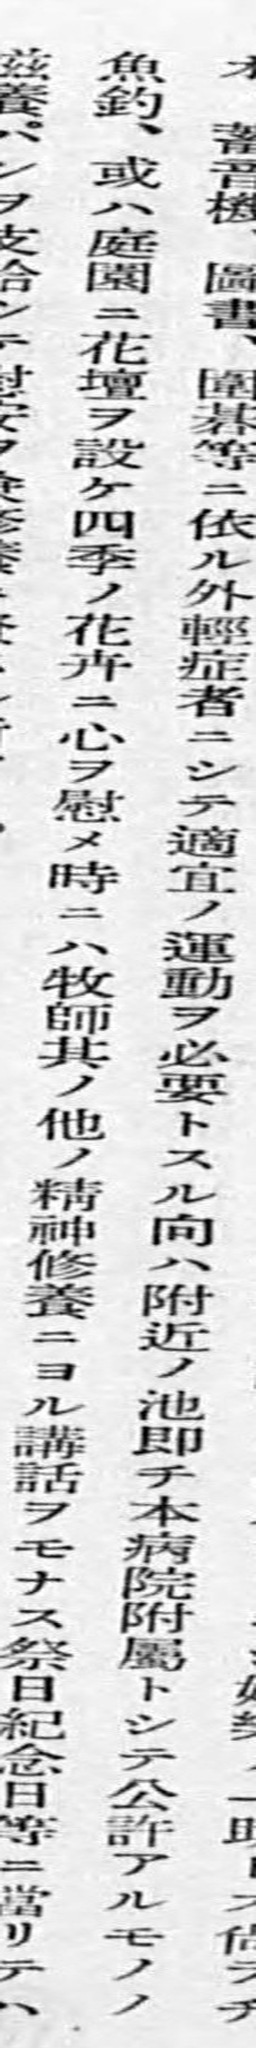魚釣、或ハ庭園ニ花壇ヲ設ケ四季ノ花卉ニ心ヲ慰メ時ニハ牧師其ノ他ノ精神修養ニヨル講話ヲモナス祭日紀念日等ニ当リテハ
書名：豊橋市立高山病院年報. 昭和12年度
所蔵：国立国会図書館 National Diet Library, JAPAN
